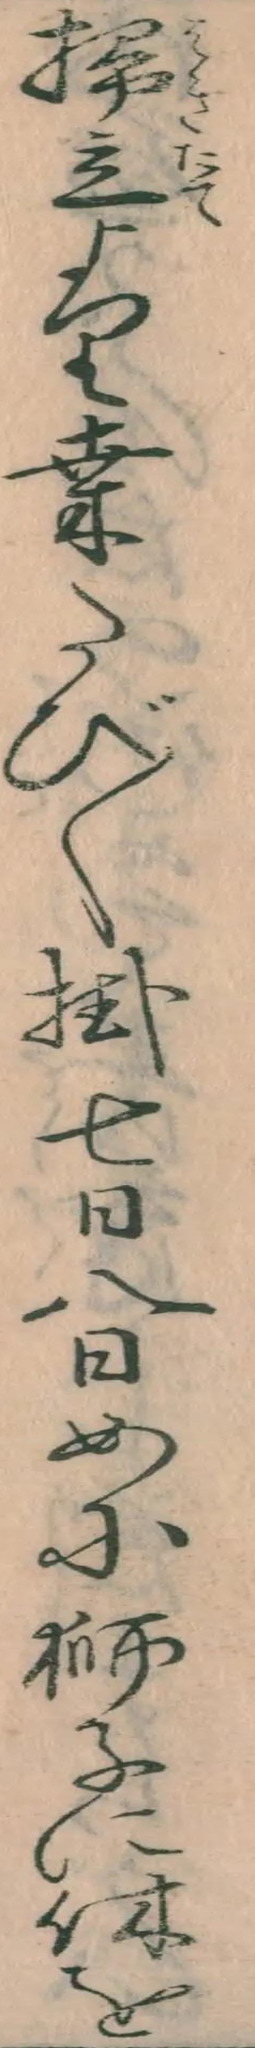掃立より桑たび〳〵掛七日八日めに獅子に休を
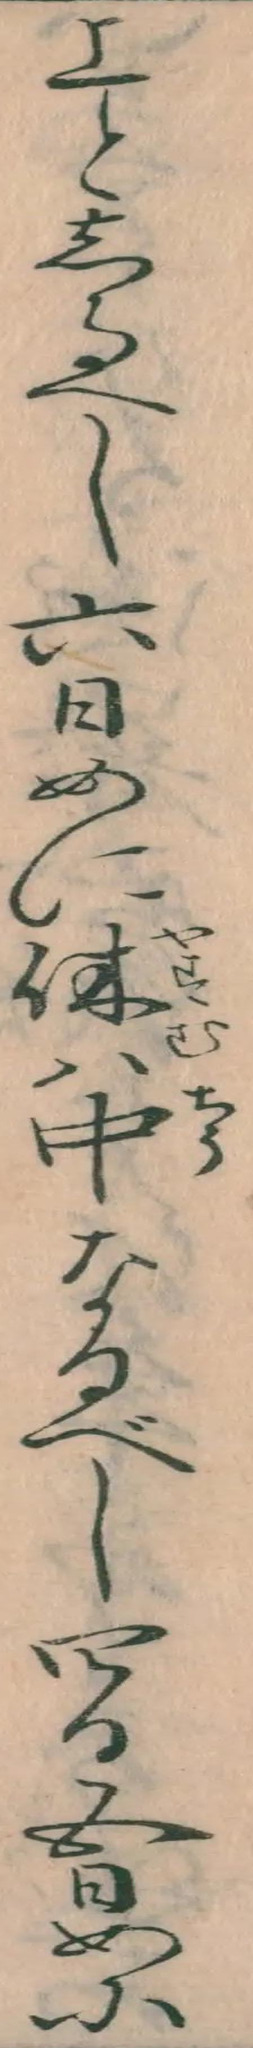上としるへし六日めに休は中なるべし四日五日めに
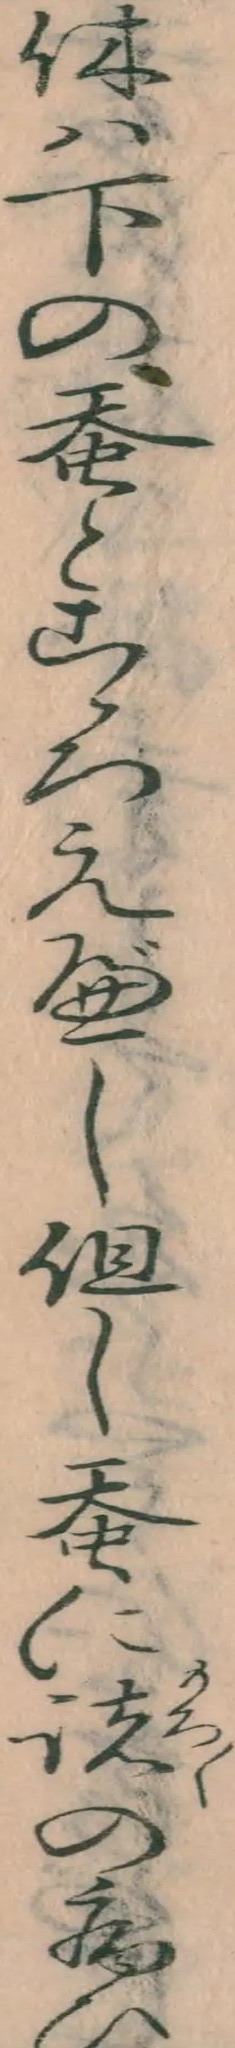休は下の蚕とこゝろえべし但し蚕に諸の病ひ
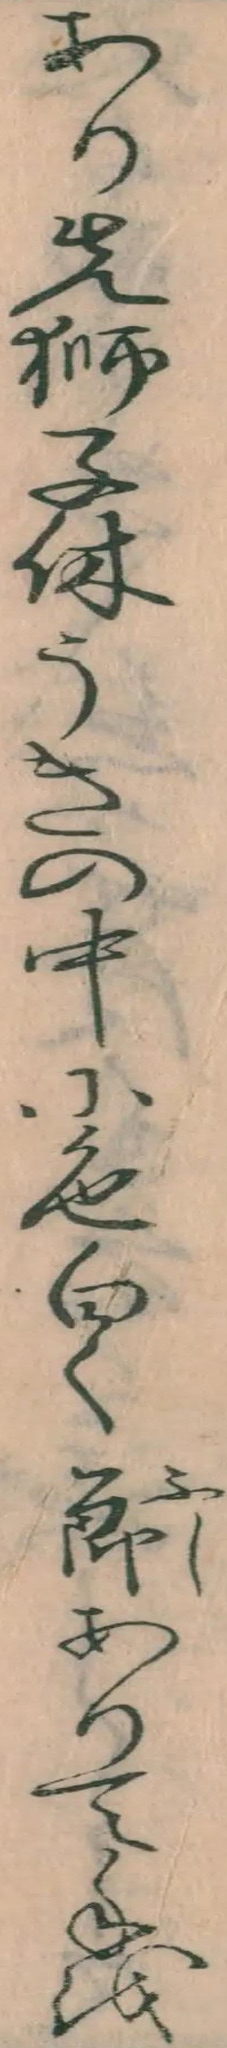あり先獅子休うきの中に色白く節ありて手を
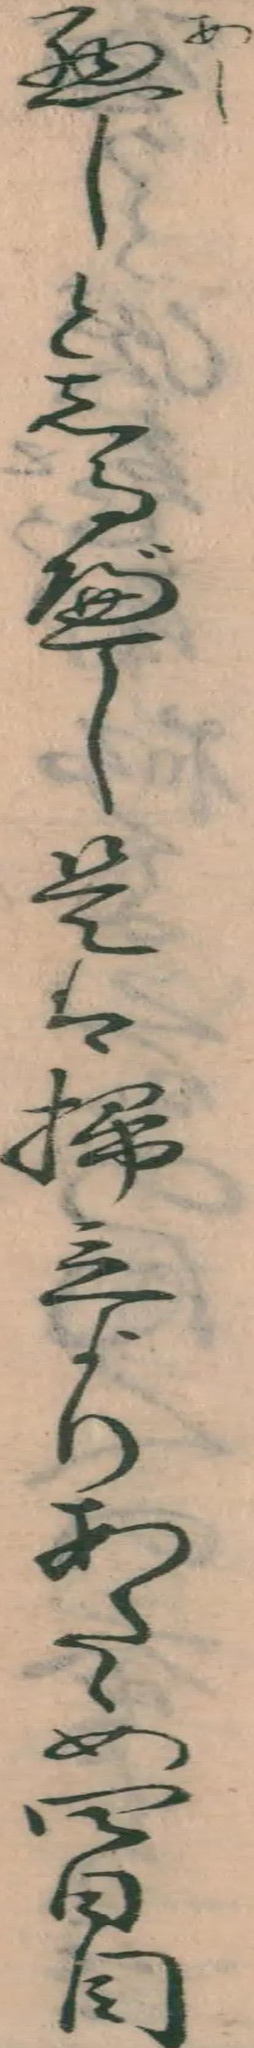悪しとしるべし是は掃立よりあたゝめ四日目
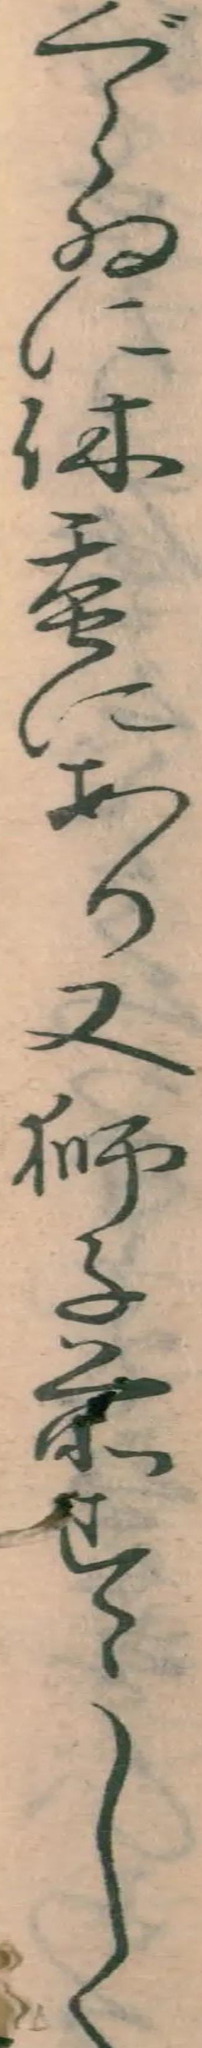ぐらゐに休蚕にあり又獅子前すゝしく
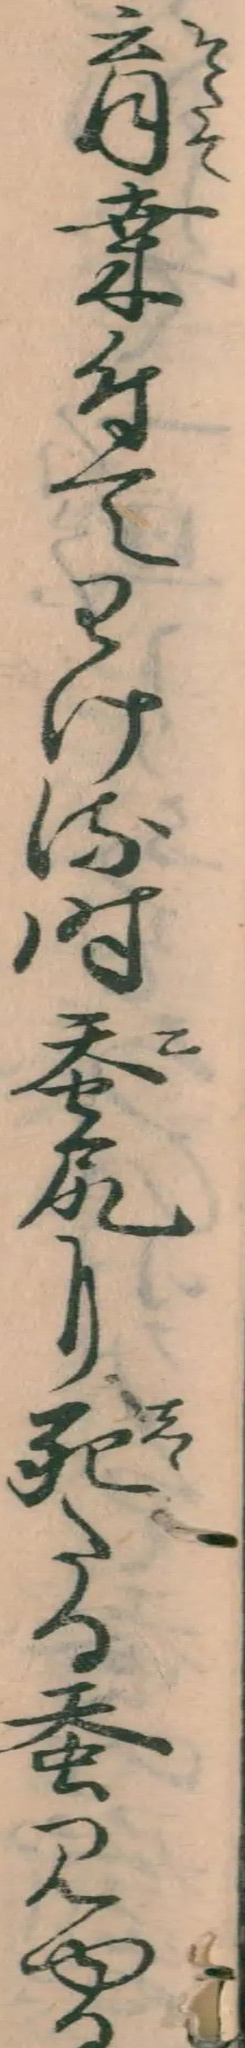育桑付てわける時蚕尻に死たる蚕見ゆる
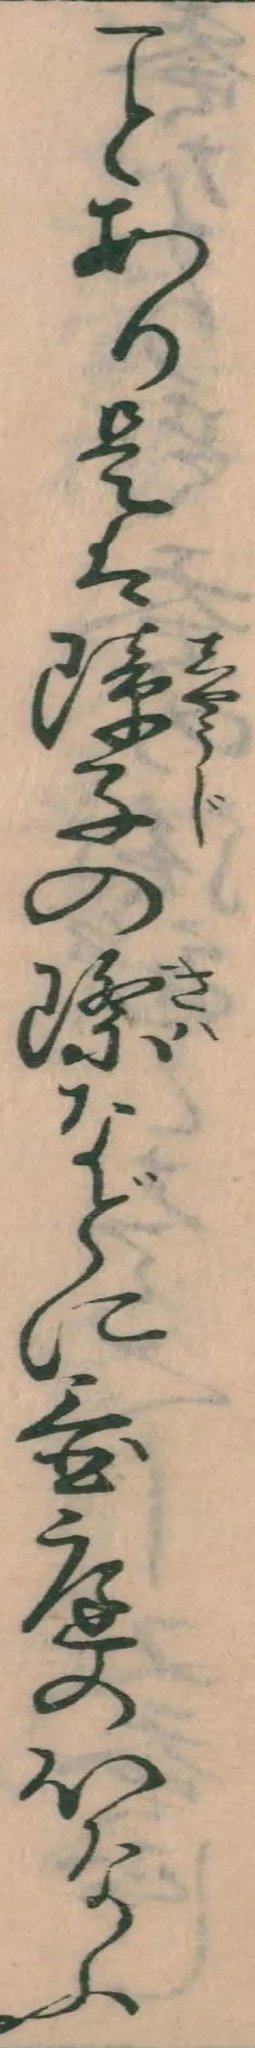ことあり是は障子の際などに置庭のほなふ
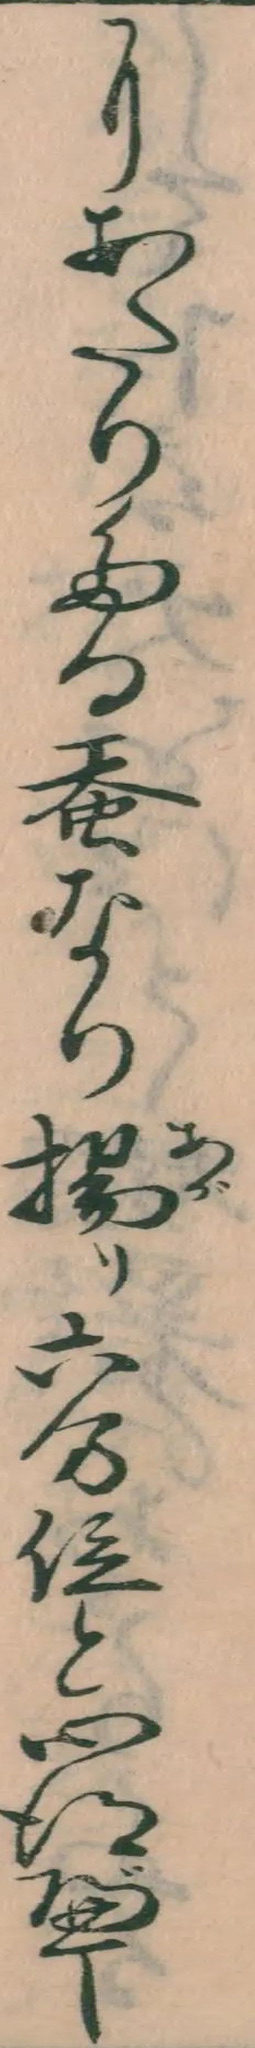にあたりたる蚕なり揚り六分位と心得べし
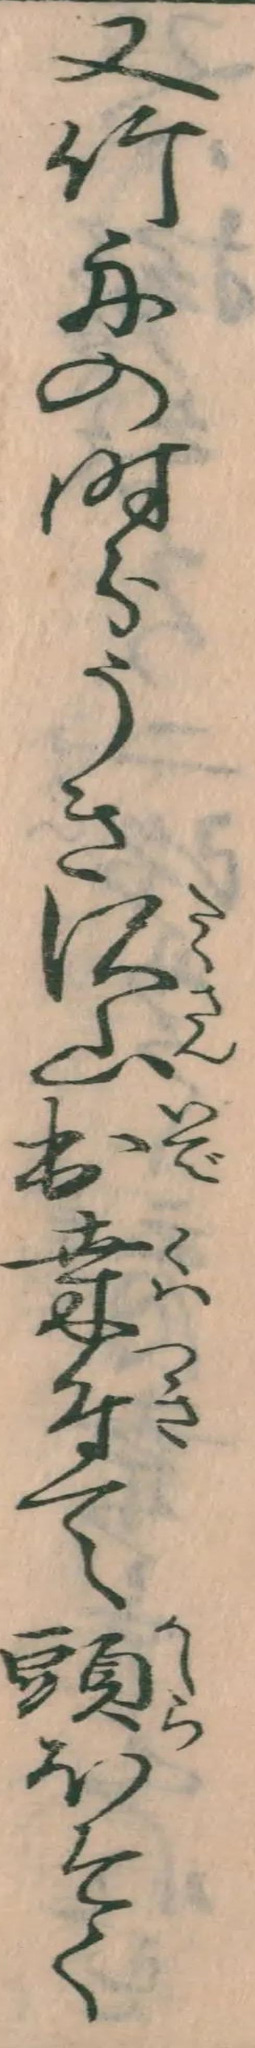又竹舟の時分うき沢山出桑付て頭ほそく
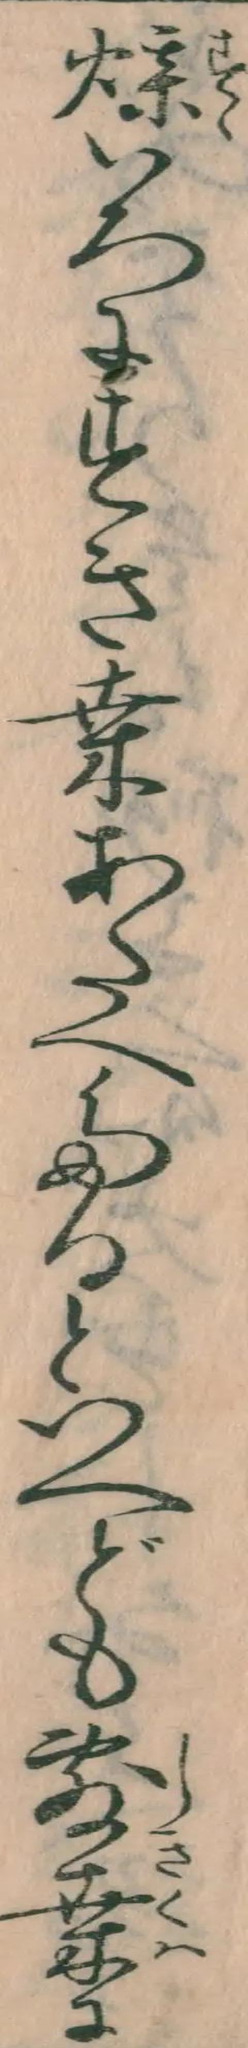煤いろにすき桑あたへたるといへども敷桑に
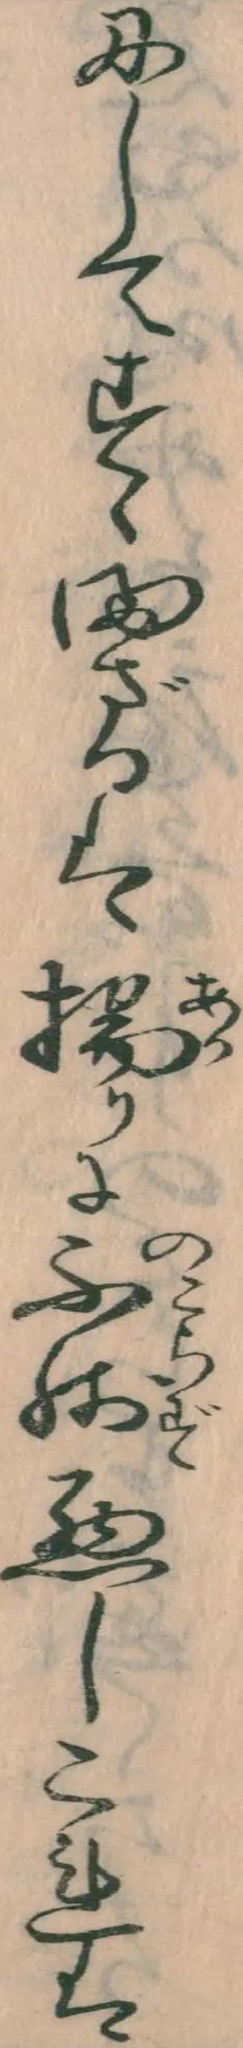にしてすゝまざるは揚りに不残悪しこれは
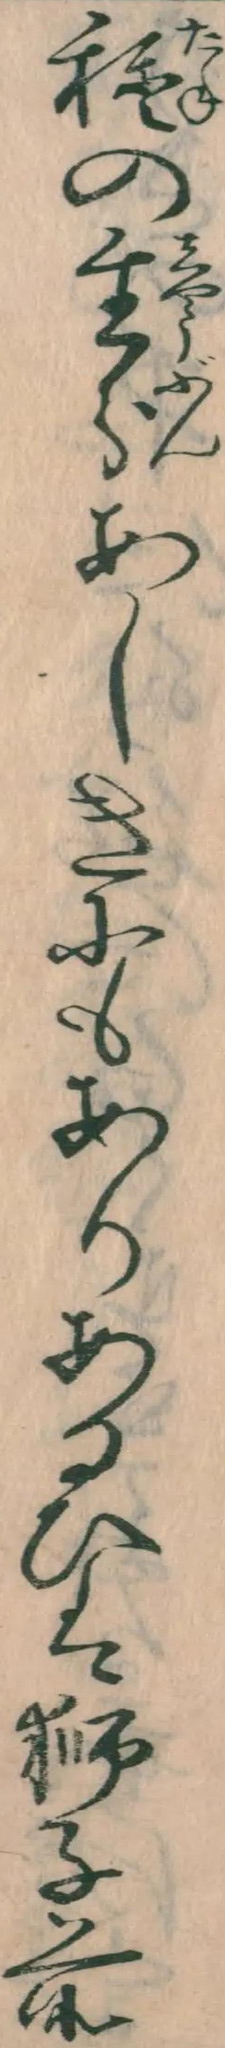種の生分あしきにもありあるひは獅子前
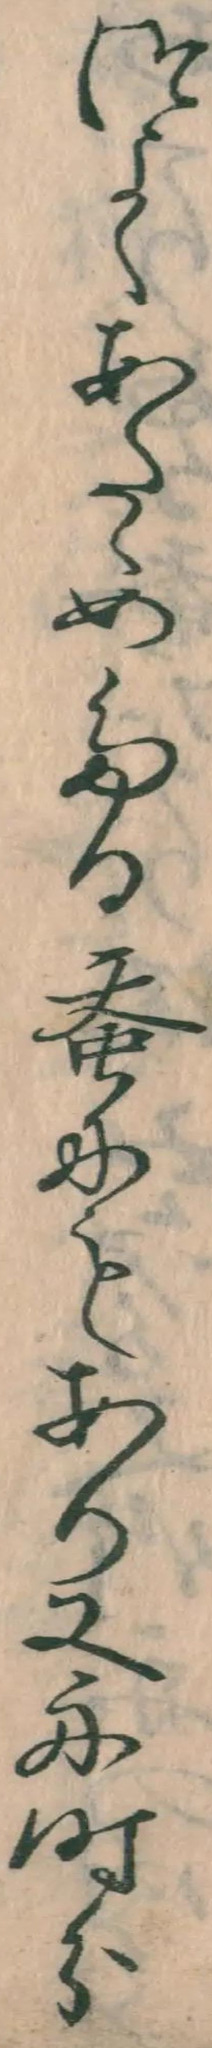つよくあたゝめたる蚕にもあり又舟時分
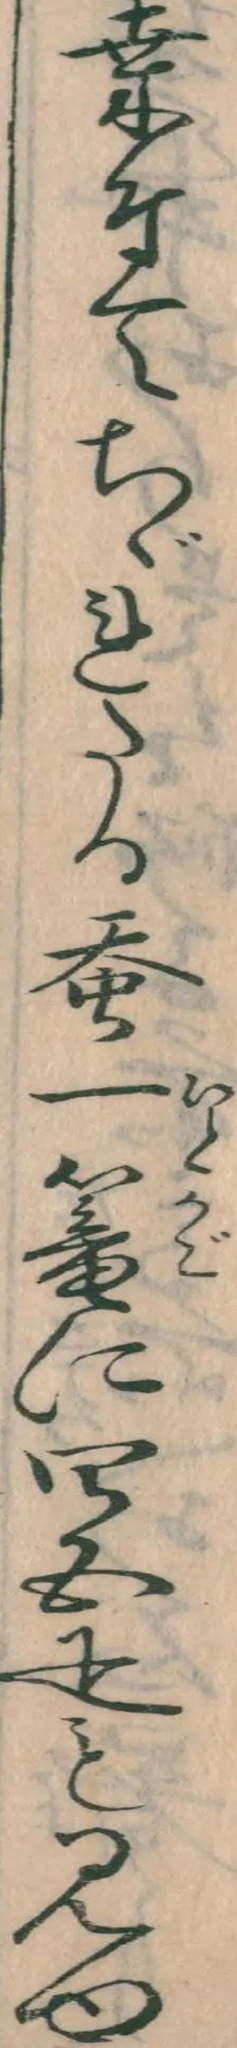桑付てちゞれたる蚕一篭に四五疋も見ゆ

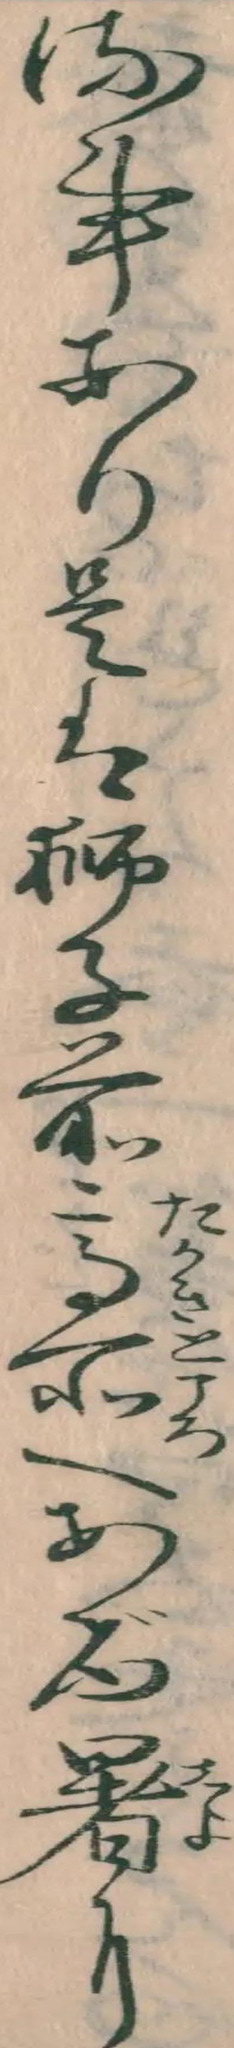る事あり是は獅子前高所へあげ暑に
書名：新撰養蚕秘書
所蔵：国立国会図書館 National Diet Library, JAPAN
